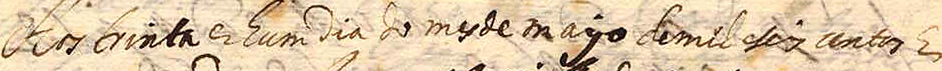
Aos trinta E hum dias do mes de mayo de mil e seiscentos E
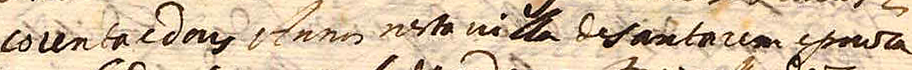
corenta e dous Annos nesta uilla de santarem e pouza
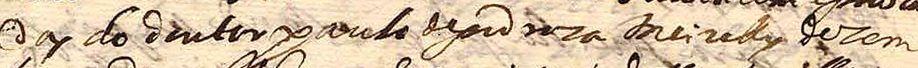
das do doutor paulo de pedroza Meirelles dezem
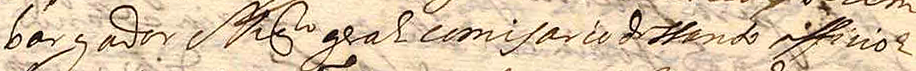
bargador e Vigro geral comisario do ssanto officio E
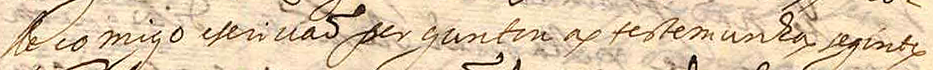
lle comigo escriuaõ perguntou as testemunhas seguintes
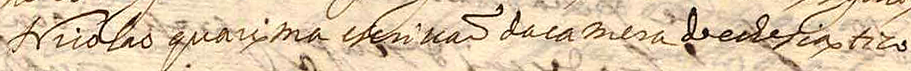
Nicolao quaresma escriuaõ da camera do eclesiastico
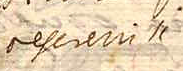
o escreui //
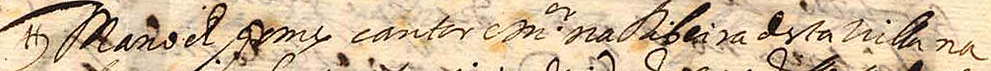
item Manoel gomes cantor e mor. na Ribeira desta Villa na
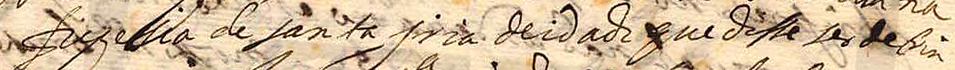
fregesia de santa Jria de idade que disse ser de trin
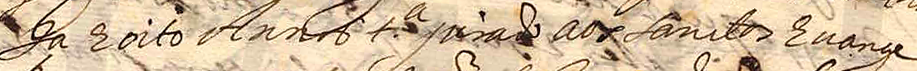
ta E oito Annos t.a jurado aos sanctos Euange
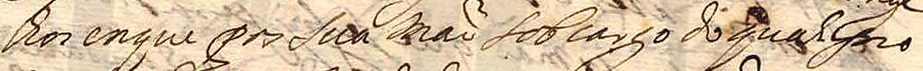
lhos en que pos sua maõ sob cargo do qual pro
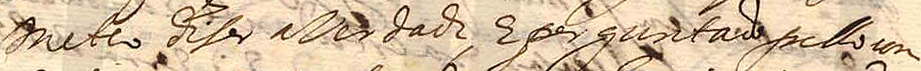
meteo diser a Verdade, E perguntado pello con
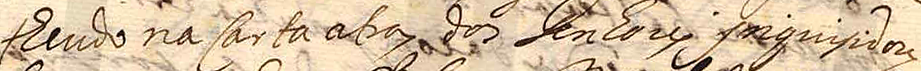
theudo na Carta atras dos senhores jnquisidores
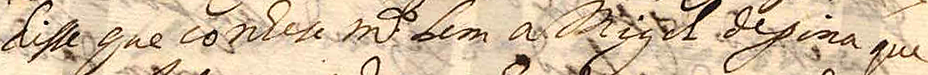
disse que conhese mto bem a Migel de pina que
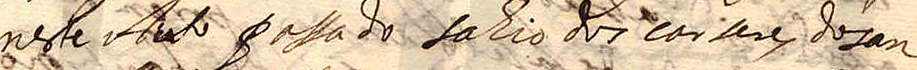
neste Auto passado sahio dos carseres do san
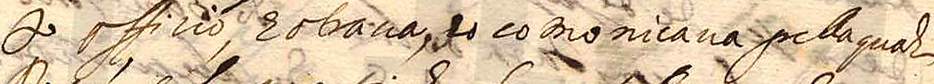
to officio, E o traua, E o comonicaua pella quaL
